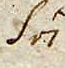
Sôs
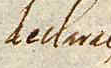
declaraç
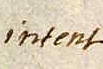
intent
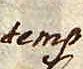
temp
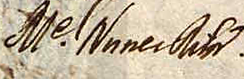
M.el Nunes Ribro
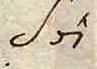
Sôs
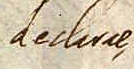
declaraç.
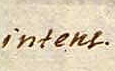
intent.
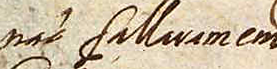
naõ fallavam em
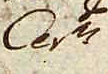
Ceras
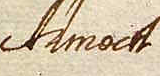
Admoest
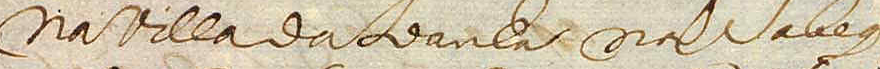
na villa da Idanha naõ Sabe q̄
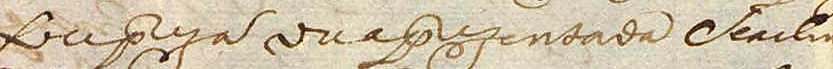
foce preza ou aprezentada se achou
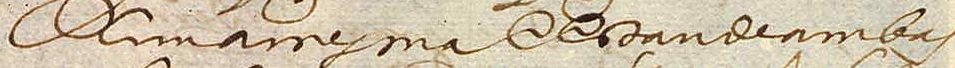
Com a mesma E Estando ambas
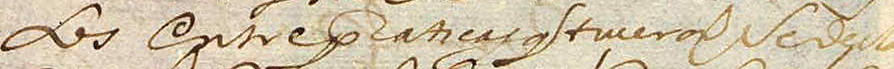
Sos entre praticas q̄ tiueraõ Se decla
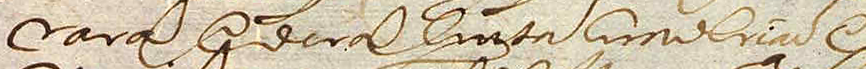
raraõ E deraõ Conta Como Criaõ E
